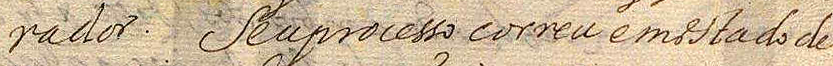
rador. Seu processo correu e moestado de
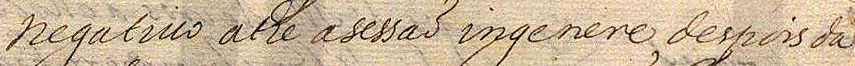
negatiuo athe a sessaõ in genere, despois da
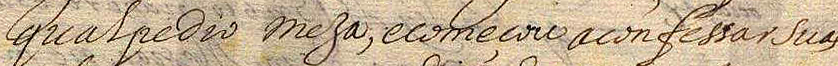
quaL pedio meza, e começou a confessar suas
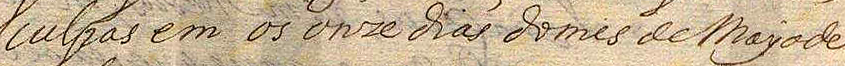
culpas em os onze dias do mes de mayo de
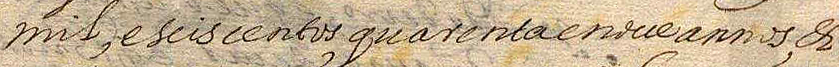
mil, e seiscentos, quarenta e noue annos, &
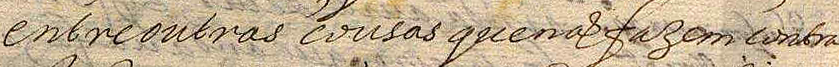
entre outras cousas que naõ fazem contra
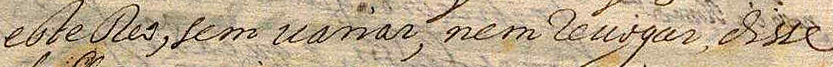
este Reo, sem uariar, nem Reuogar, disse
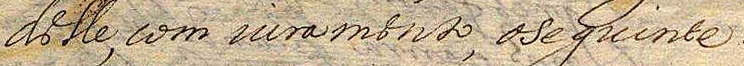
delle, com iuramento, o seguinte.
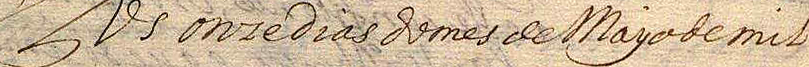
Aos onze dias do mes de Mayo de mil
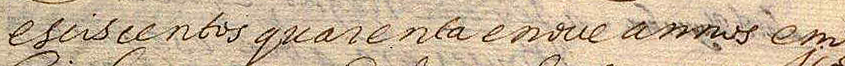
e seiscentos quarenta e noue annos em
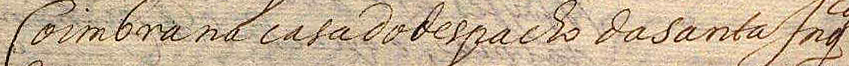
Coimbra na casa do despacho da santa Jnqcaõ.
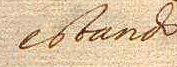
estando
